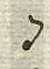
7
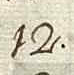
12.
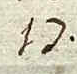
17.
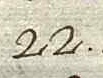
22.
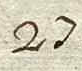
27
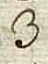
3
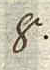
8.
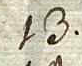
13.
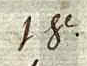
18.
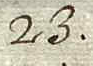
23.
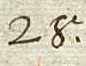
28.
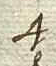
4
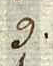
9.
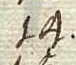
14.
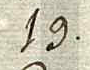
19.
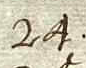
24.
